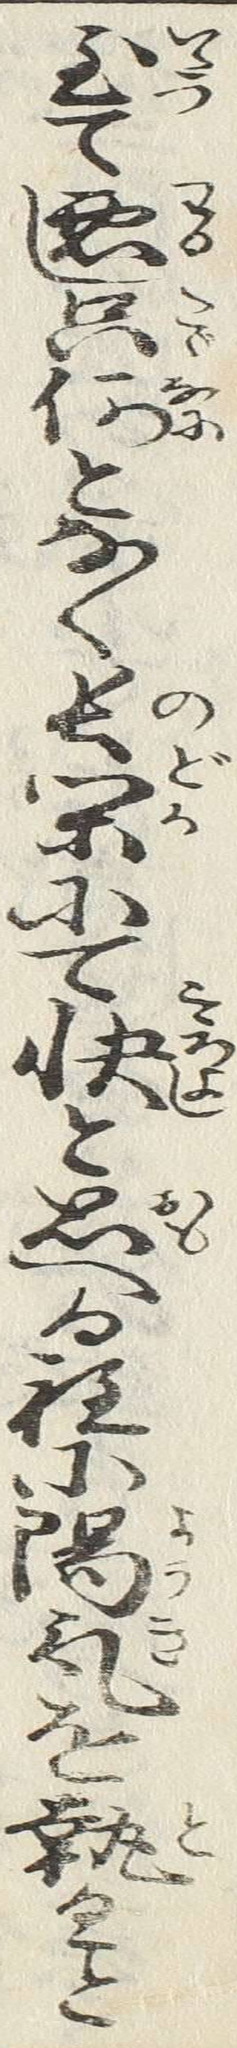至て悪し只何となく長閑にて快と思へる程に陽気を執ること
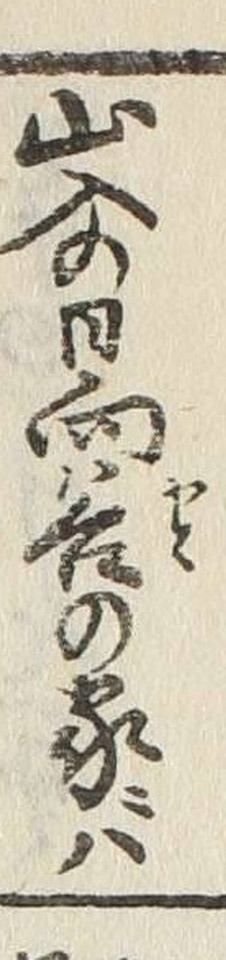山入の日向谷の家には
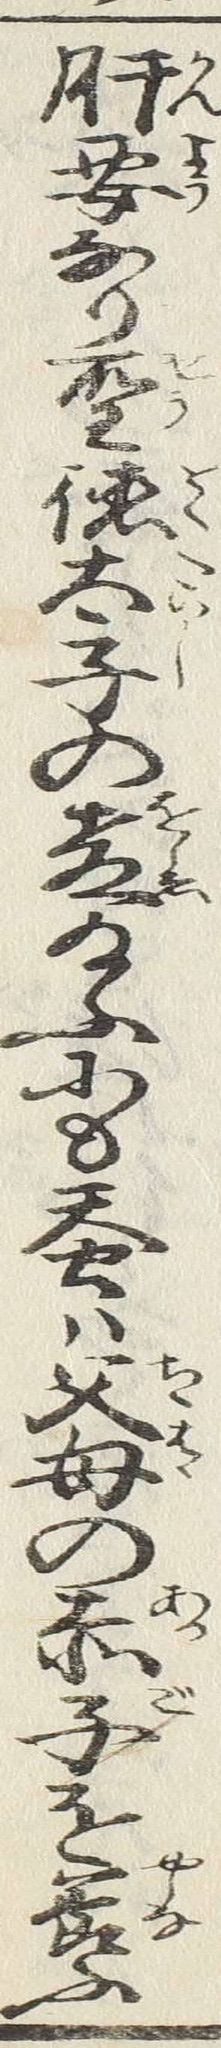肝要なり聖徳太子の教給ふにも蚕は父母の赤子を養ふ
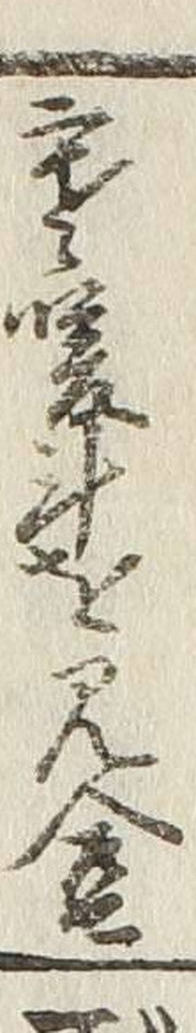寒暖計を見合せ
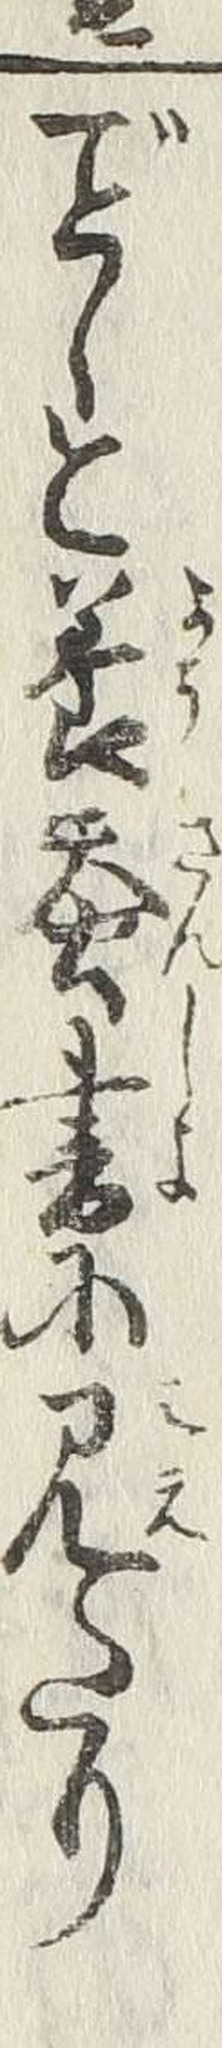ごとしと養蚕書に見たり
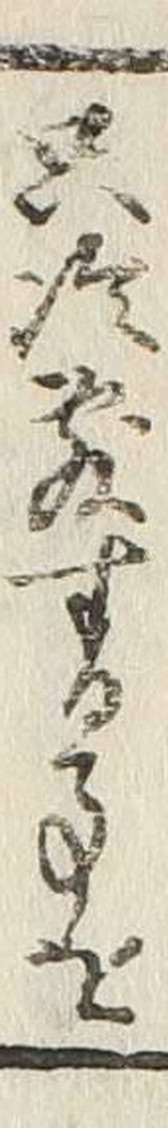只冷敷する事を
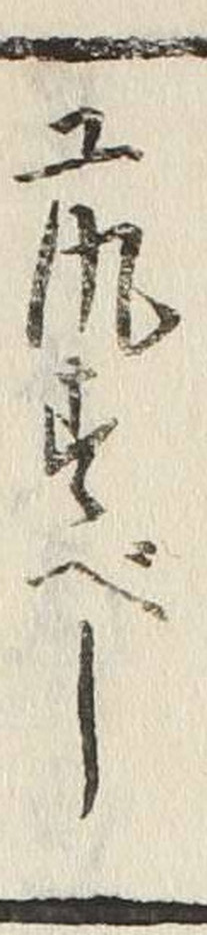工風すべし
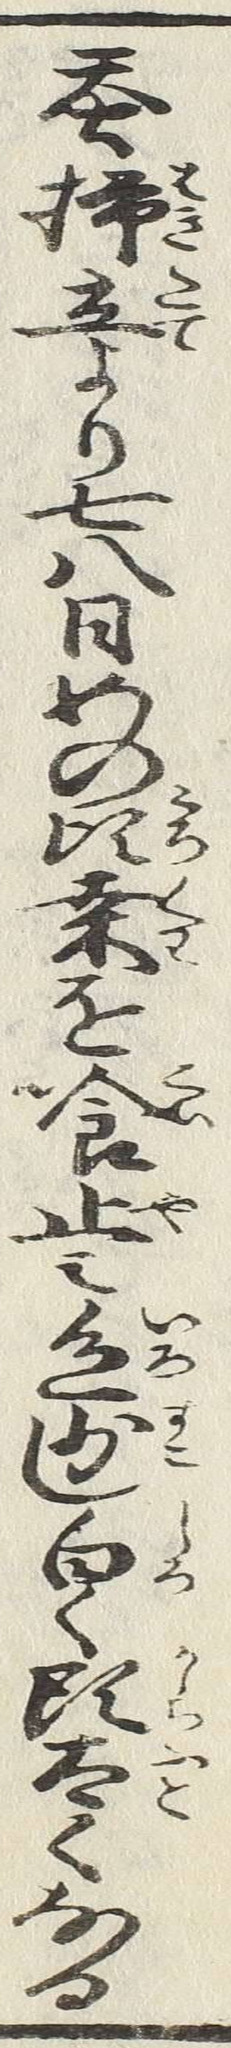蚕掃立より七八日めの頃桑を喰止み色少し白く頭太くなる
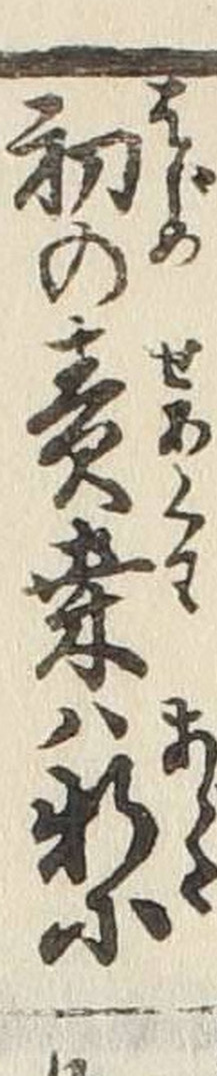初の責桑は新に
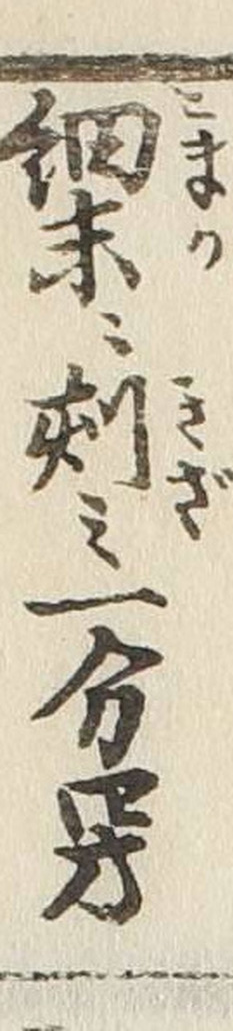細末に刻み一分四方
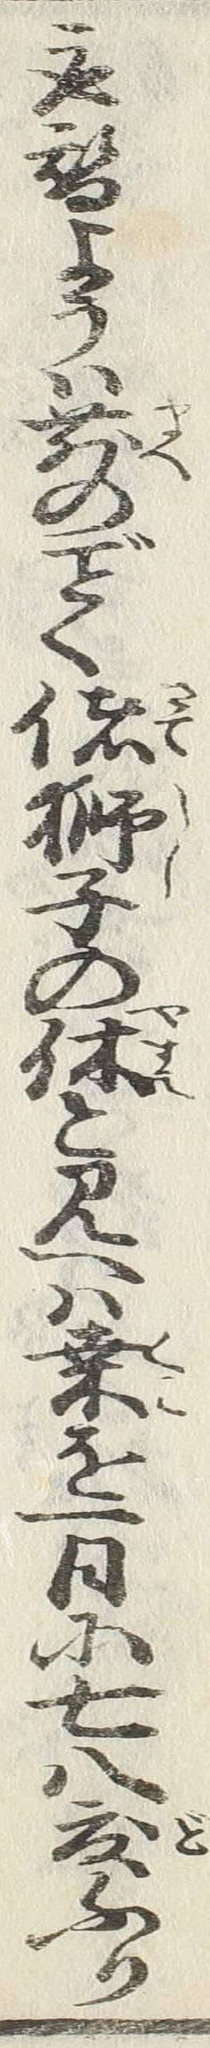取替ようは前のごとく偖獅子の休と見へは桑を一日に七八度ふり
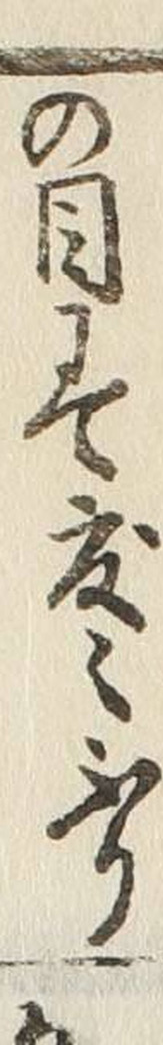の目にて度々ふり
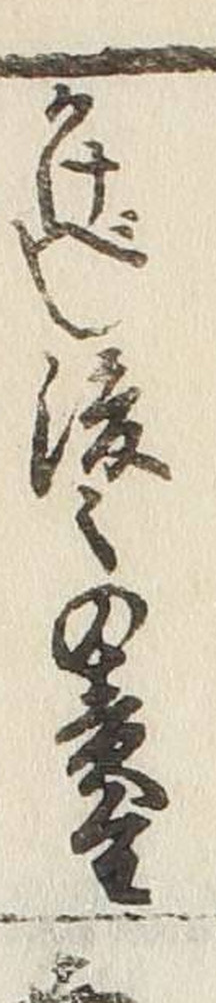かけべし後々の責くわ
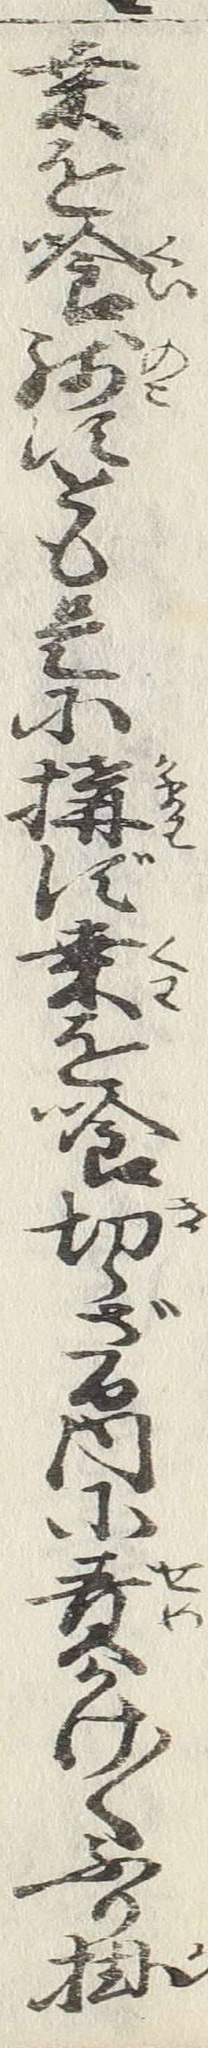桑を喰残すとも是に搆ず桑を喰切らざる内に責かけ〳〵ふり掛
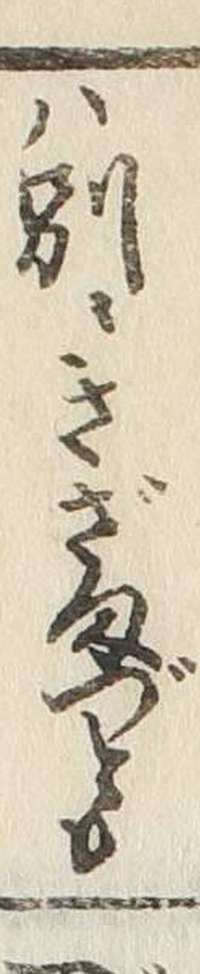は別にきざまづとも
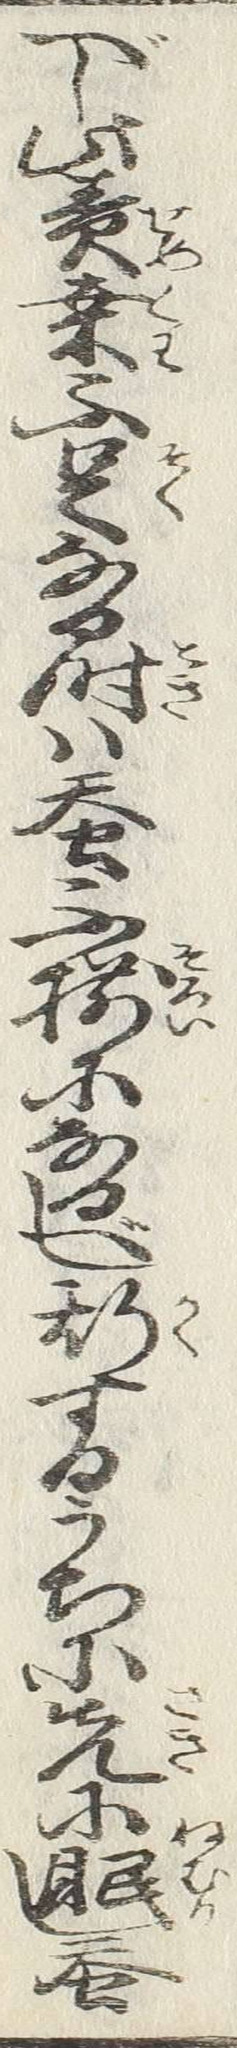べし此責桑ふ足なる時は蚕ふ揃になるべし斯するうちに先に眠し蚕
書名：養蠶實驗録
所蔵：東京大学農学生命科学図書館 国文学研究資料館
